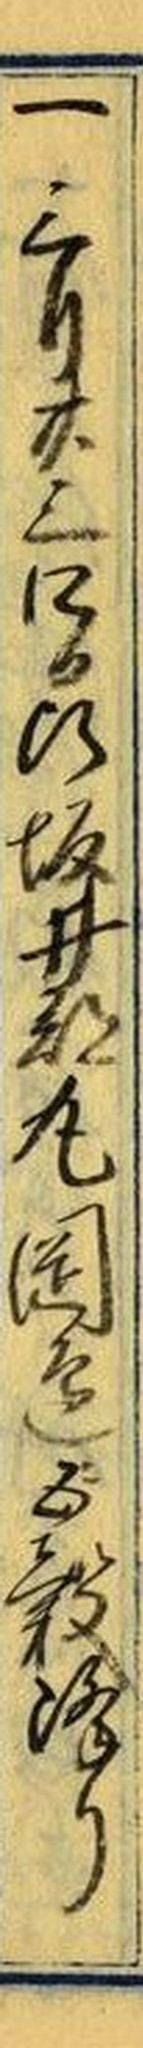一三月廿三四日頃坂井郡丸岡辺五穀降り
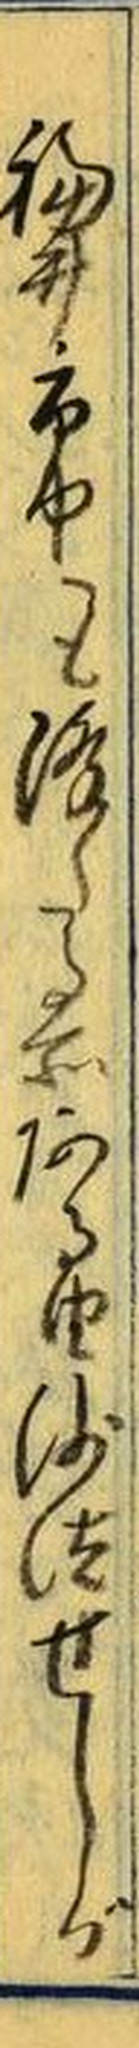福井市中へも降たる所ある由沙汰せしが
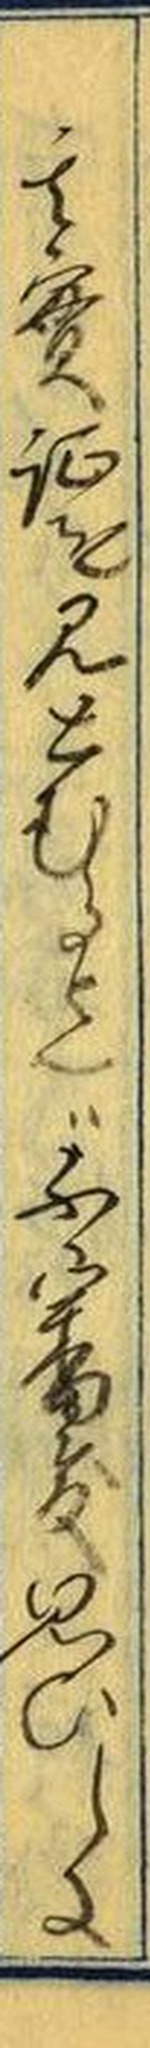其実証を見とむる迄は不審敷思ひしに
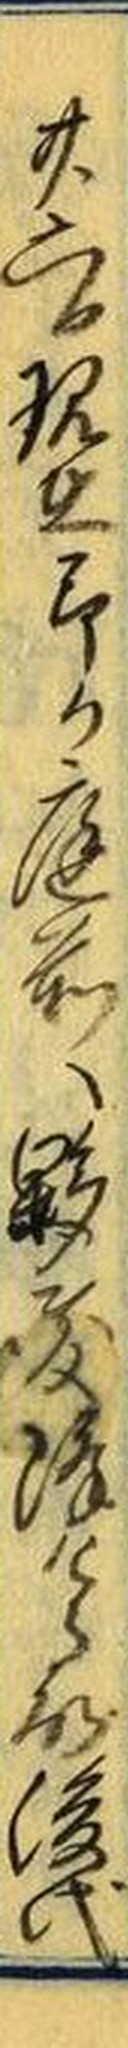廿六日現在予か庭前へ夥敷降ける故後代
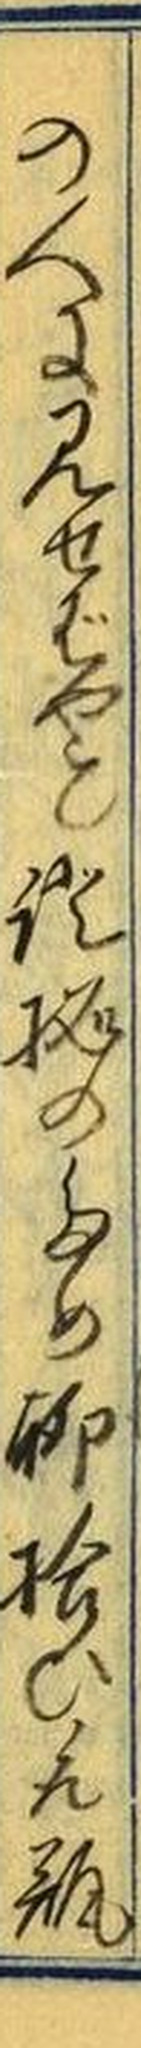の人に見せばやと証拠のため聊拾ひ取瓶
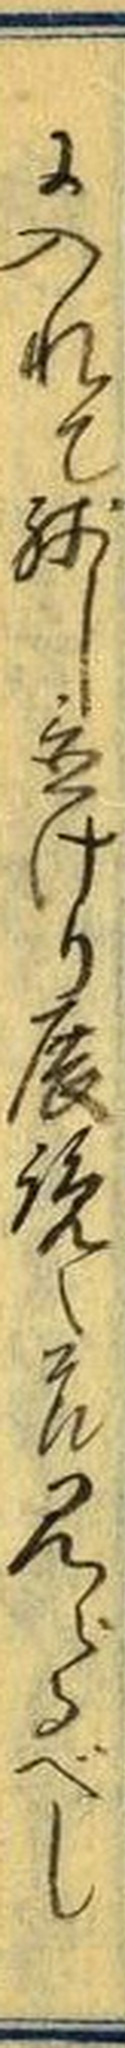に入れて残し置けり展覧の節見らるべし
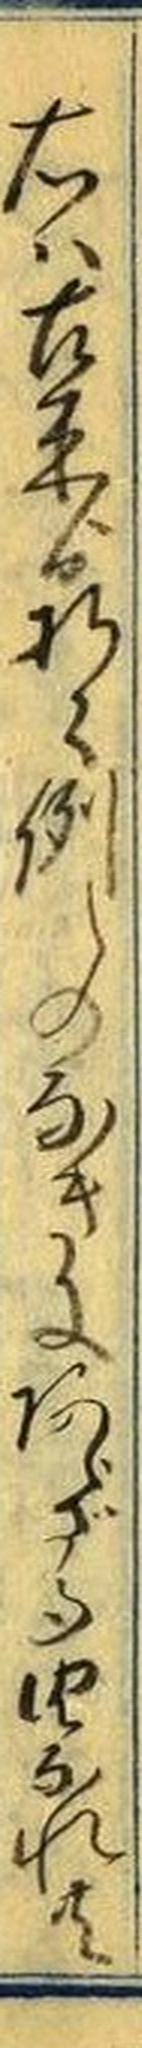右は古来ゟ折々例しのなきにあらざる由なれ共
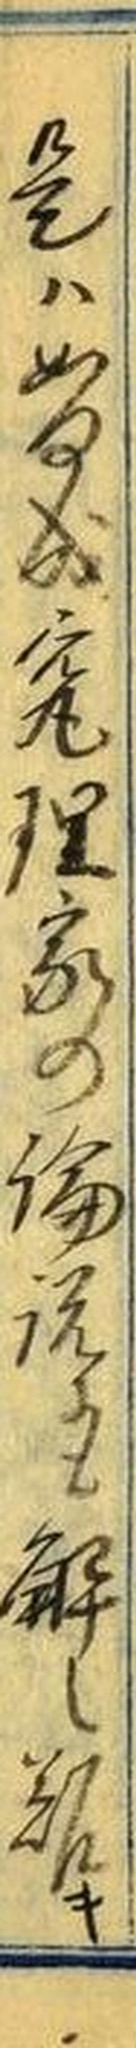是は如何成究理家の論説にも解し難き
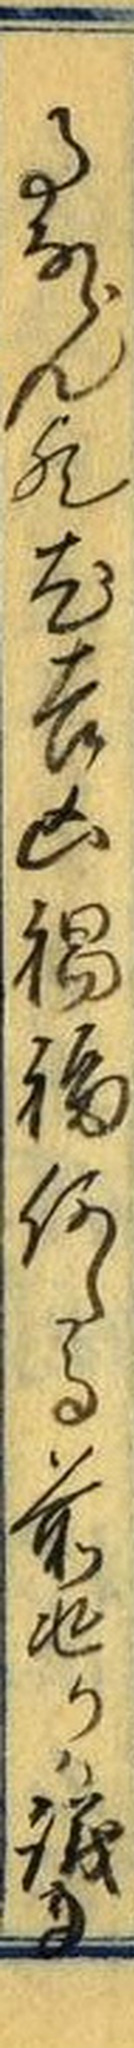事ならんか尤吉凶禍福何たる前兆かは議す

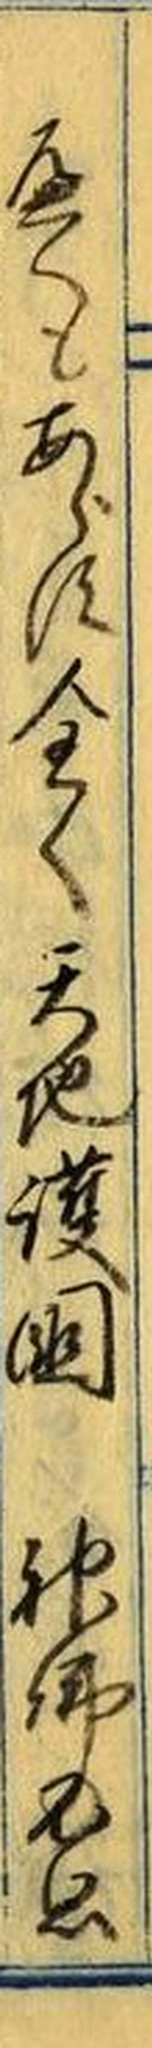へくもあらす全く天地護国神仏不思
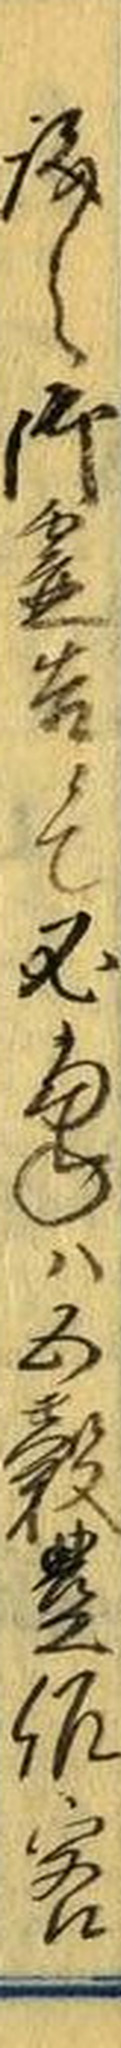儀之御霊告にて必当年は五穀豊作客
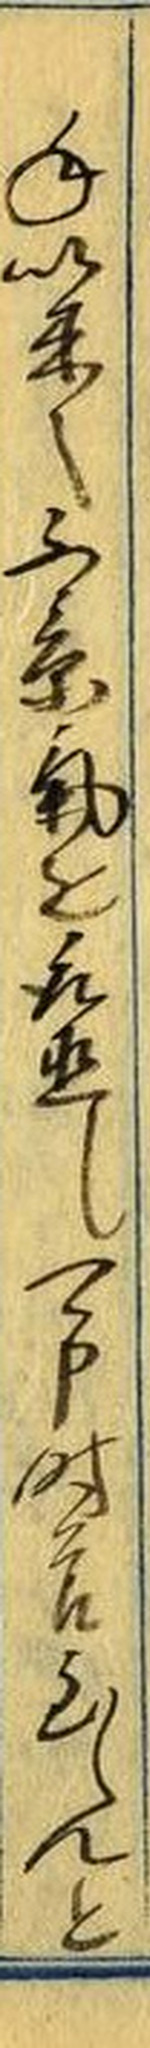年以来之不景気を取直し可申時節至らんと
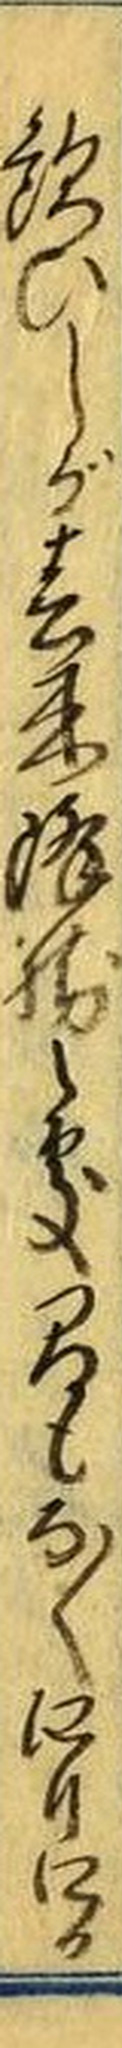歓ひしが春来降勝之処間もなく四月四日
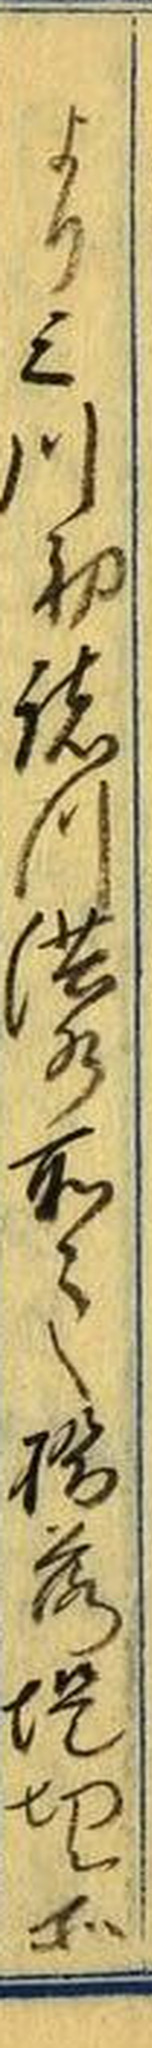より三川初諸川洪水所々之橋落堤切れ所
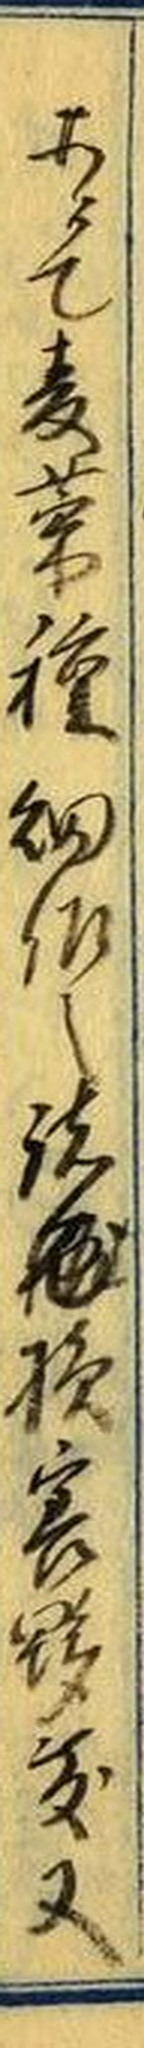等にて麦菜種畑作之諸色損害夥敷又
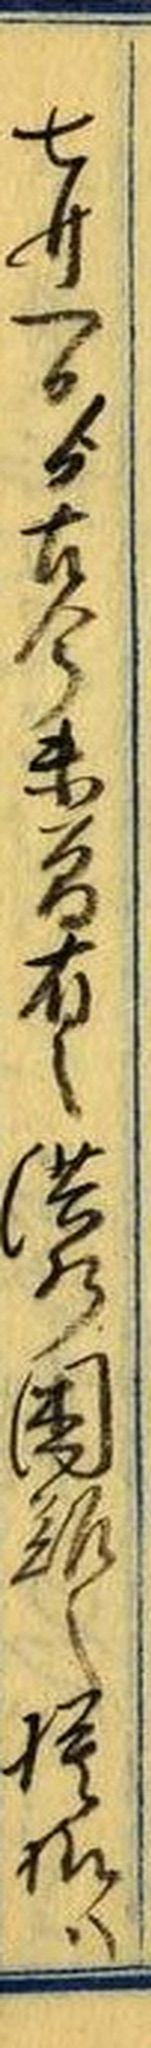七月一日ゟ古今未曾有之洪水困難之模様は
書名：温古集 五巻
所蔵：福井県文書館 Fukui Prefectural Archives
